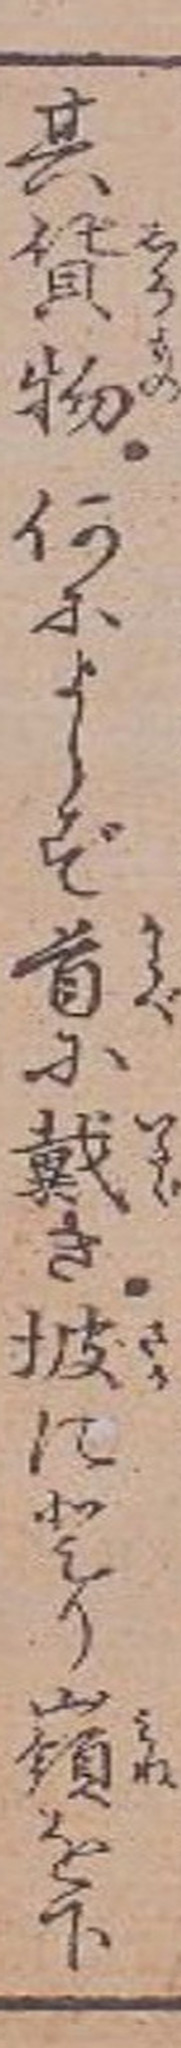其貨物•何によらず首に戴き•坂に登り嶺を下
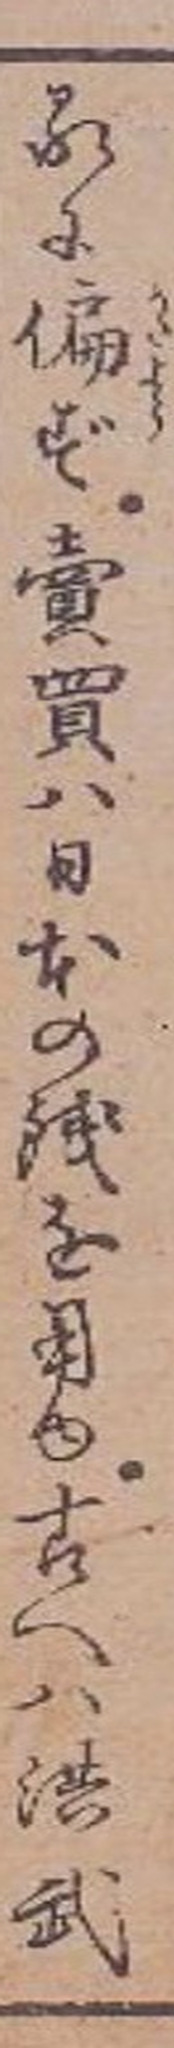るに偏ず•売買は日本の銭を用ゆ•古へは洪武

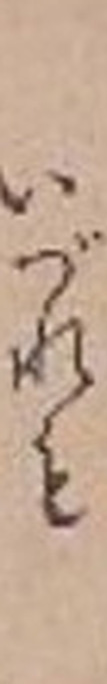いづれも
